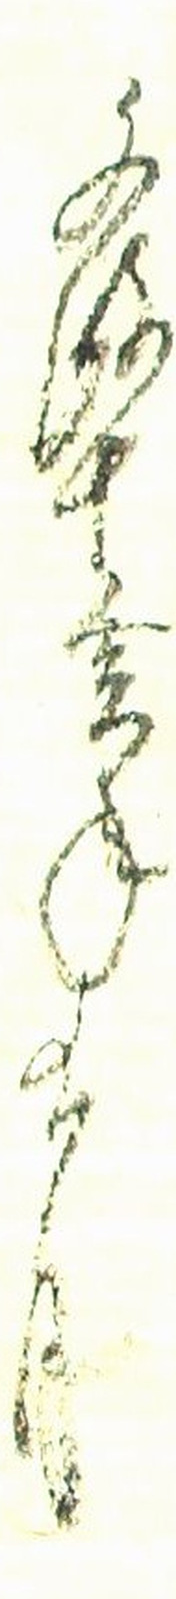文政十亥年十一月
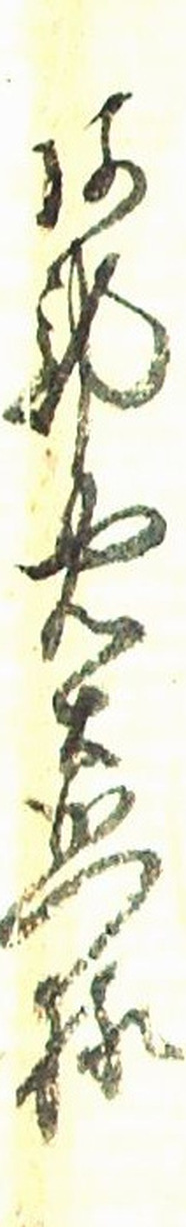阿部忠右衛門様
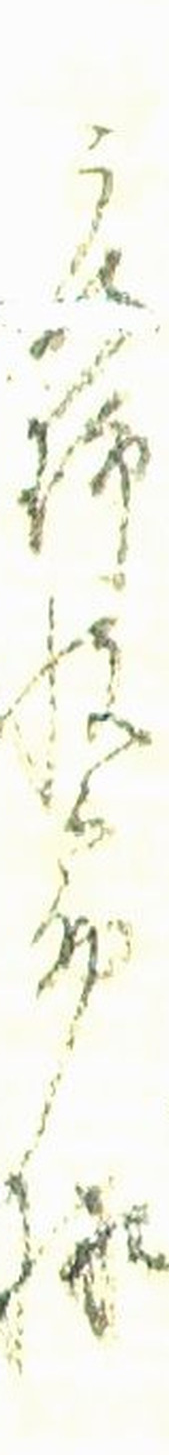庄野悦次郎様
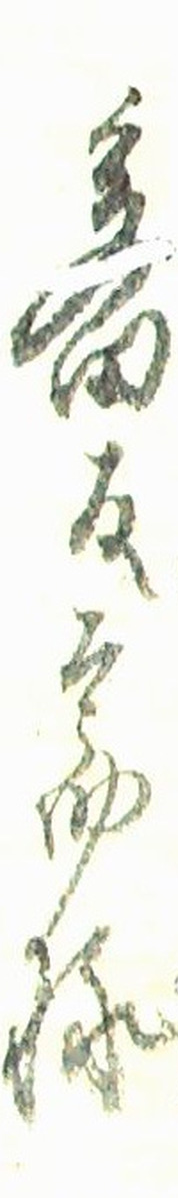多田友太郎様

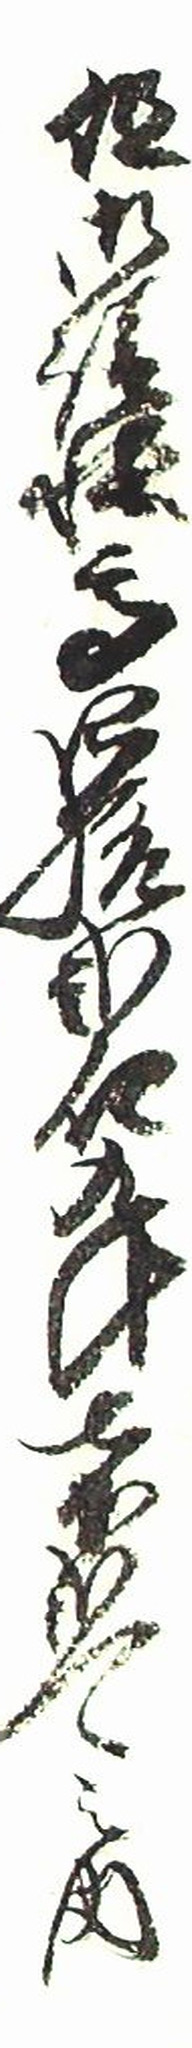但御請帳高四拾弐石九斗七升弐合之内
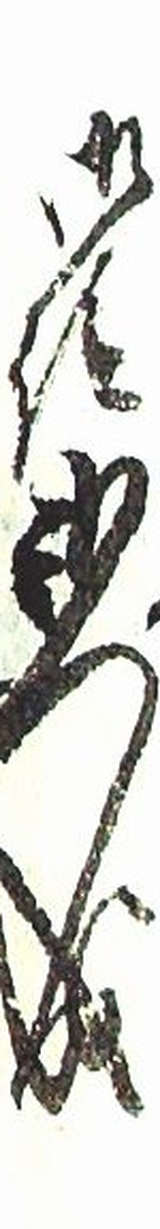御請弐つ成
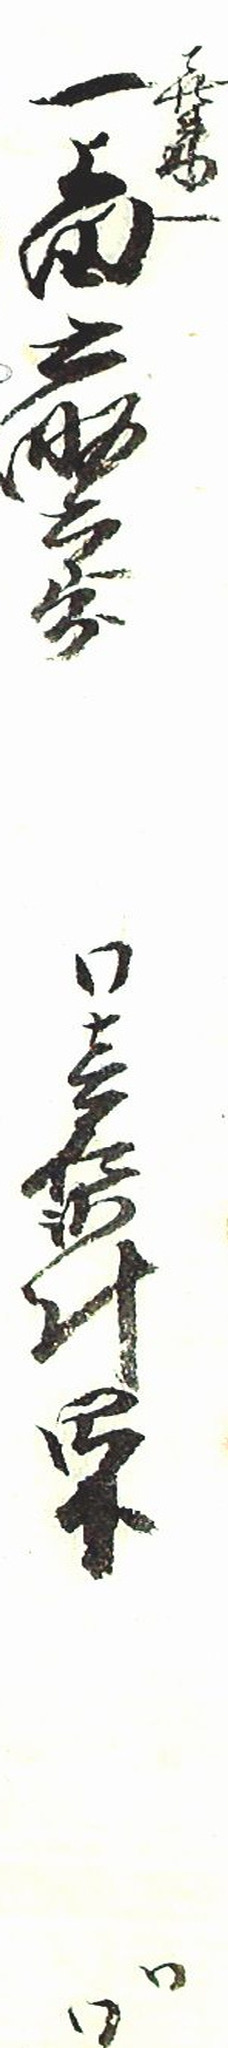一上田六畝六歩同壱石弐斗四升同人
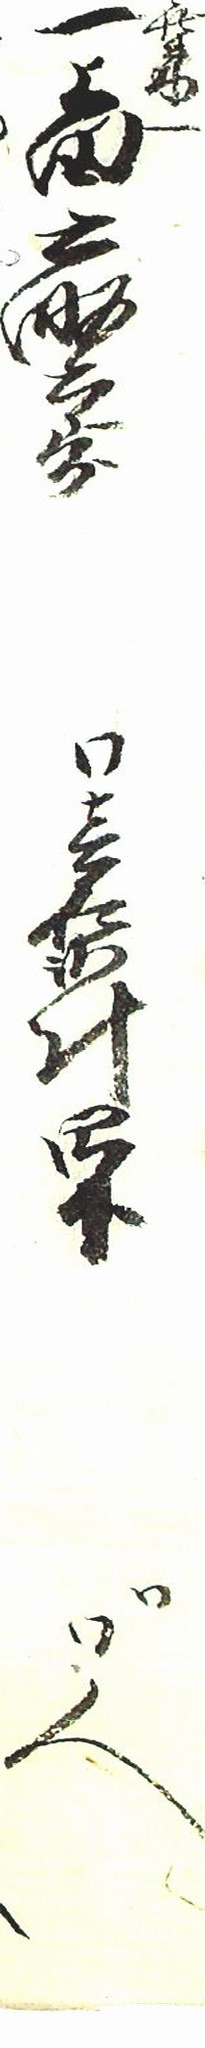一上田六畝六歩同壱石弐斗四升同人
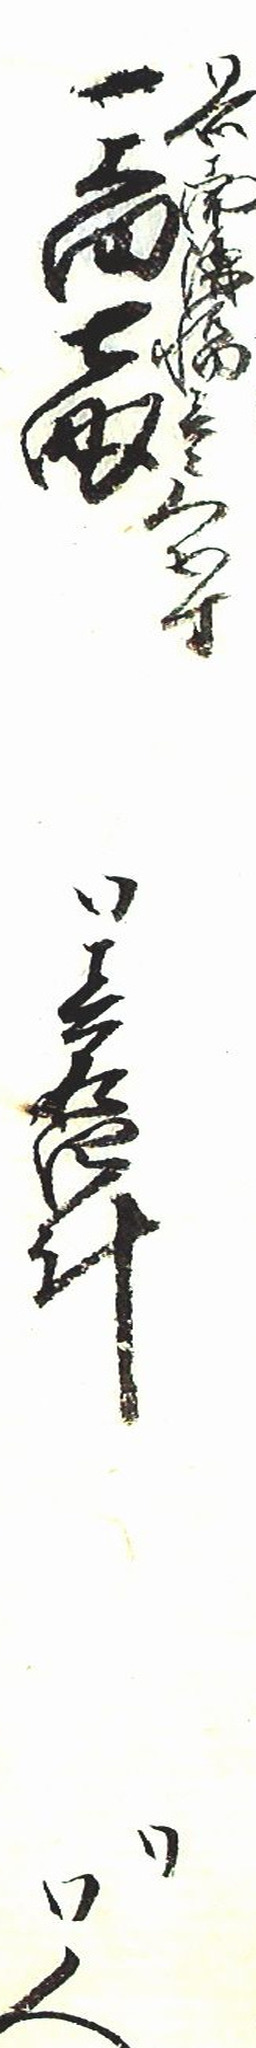一上田七畝同壱石四斗同人
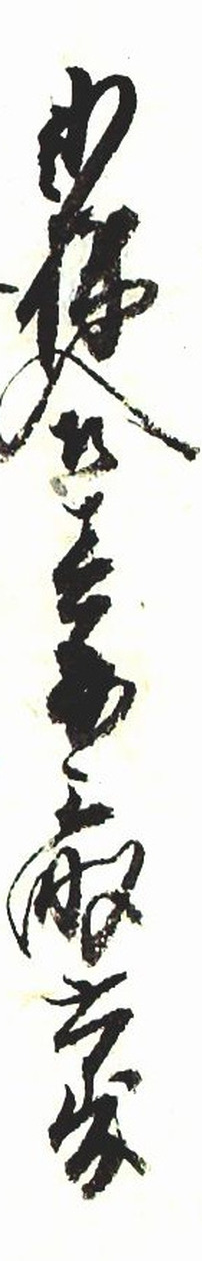弐株合壱反三畝六歩
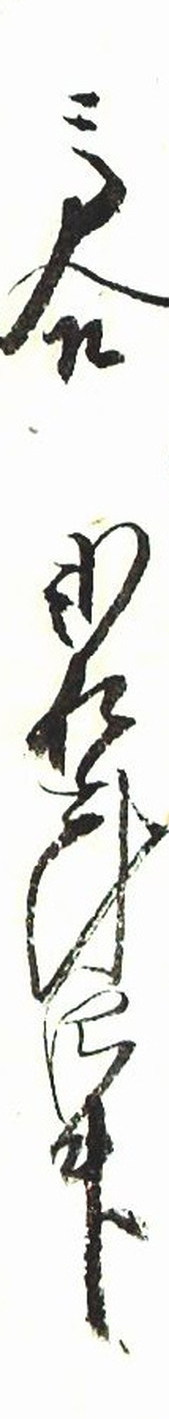高合弐石六斗四升
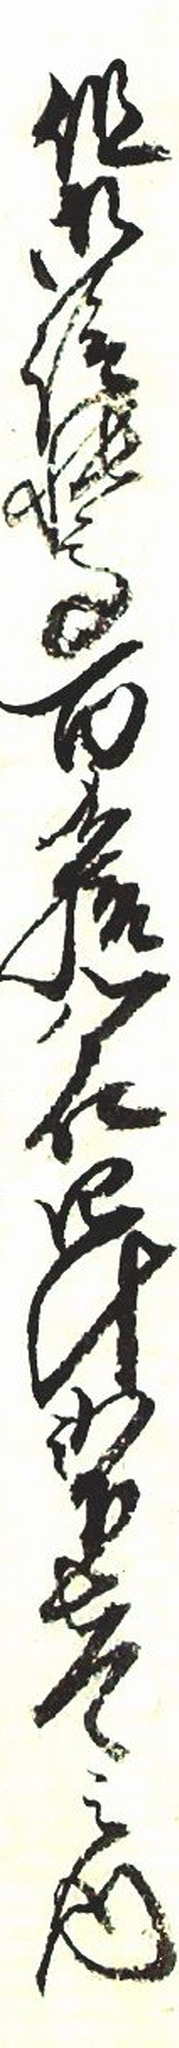但御請帳高百九拾八石四斗弐升七合之内
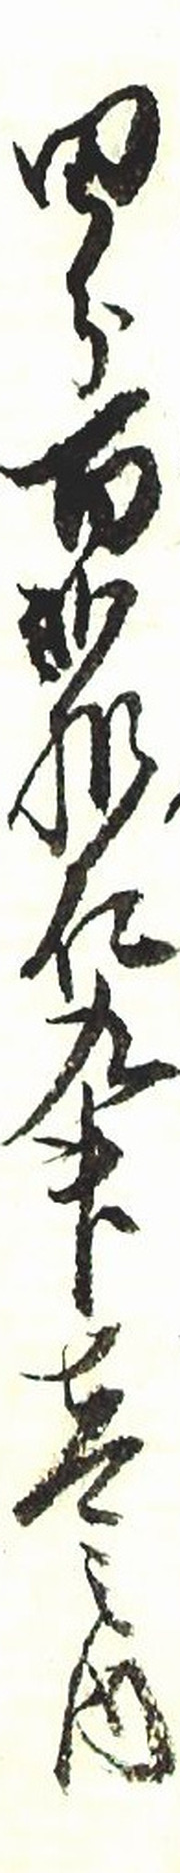田分百弍拾石九升七合之内
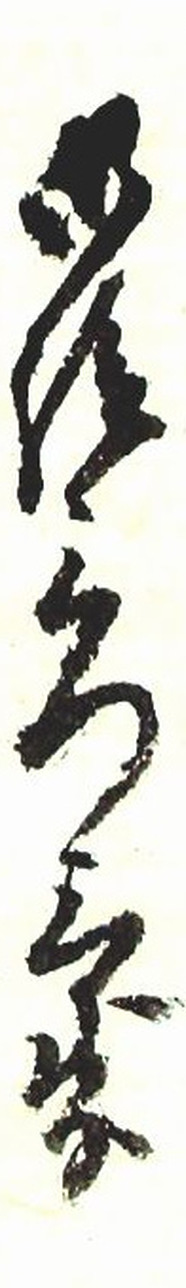御請三つ三歩
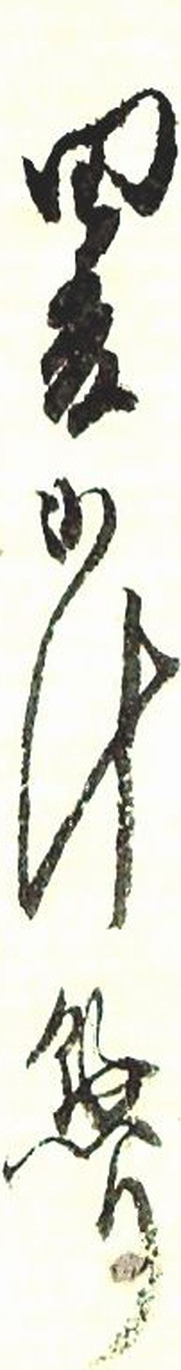田取弐斗懸り
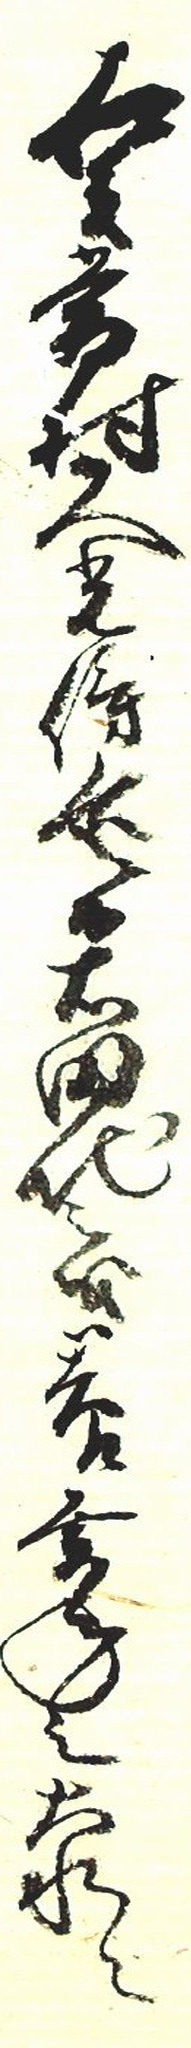右は当村久光傍示にて右田地之義は去る亥年之大水に
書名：諸御願書控(弐番）
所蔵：鳴門教育大学 Naruto University of Education
